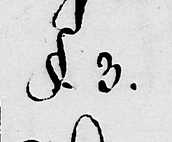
§. 3.
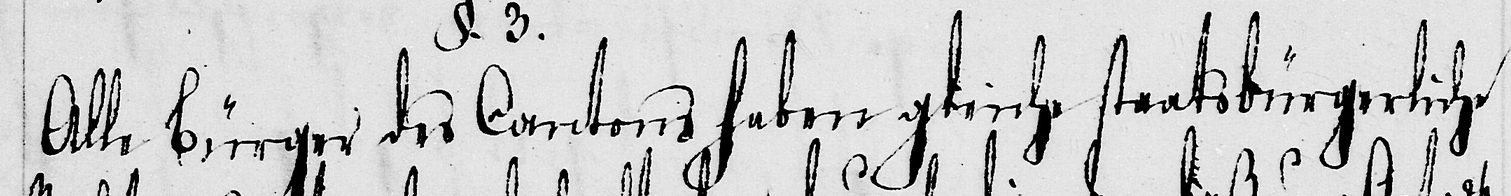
Alle Bürger des Cantons haben gleiche staatsbürgerlic¬
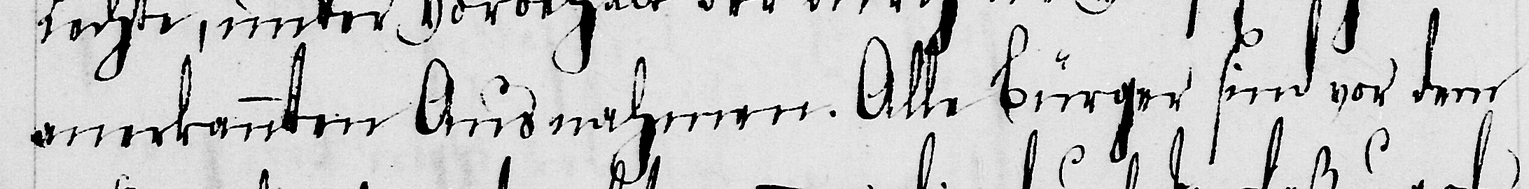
anerkannten Ausnahmen. Alle Bürger sind vor dem
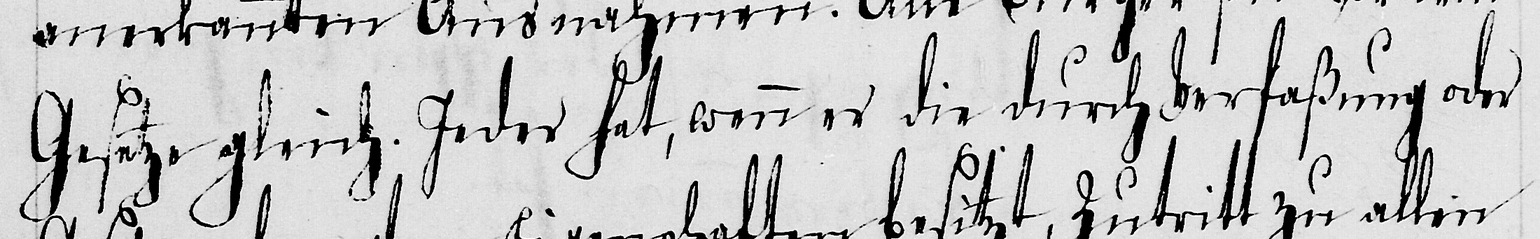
Gesetze gleich. Jeder hat, wenn er die durch Verfaßung oder
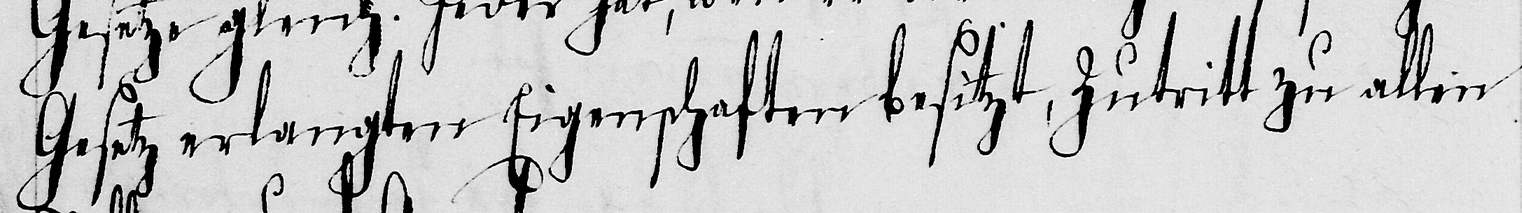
Gesetz erlangten Eigenschaften besitzt, Zutritt zu allen
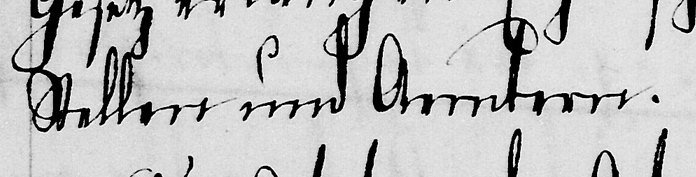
Stellen und Aemtern.
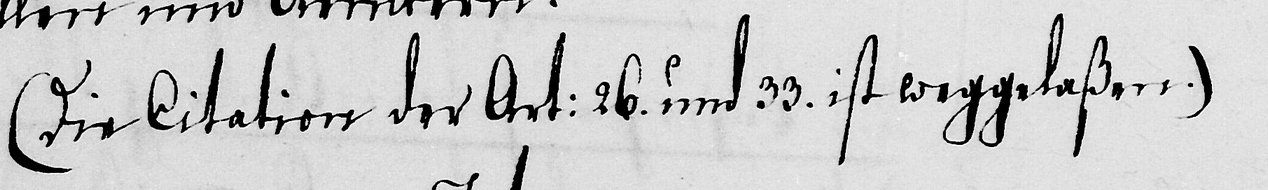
(Die Citation der Art: 26. und 33. ist weggelaßen.)
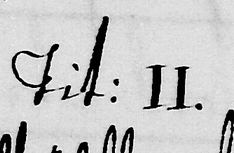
Tit: II.
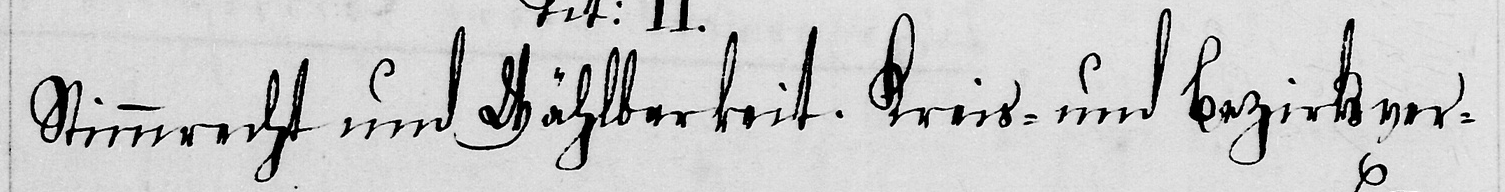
Stimmrecht und Wählbarkeit. Kreis- und Bezirksver-
